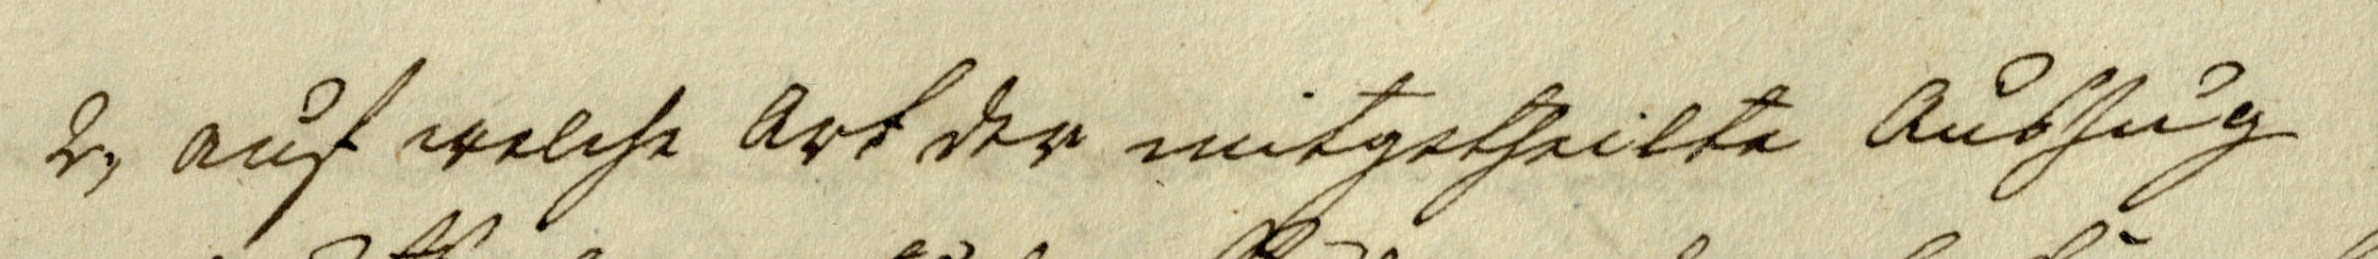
2., auf welche Art der mitgetheilte Auszug
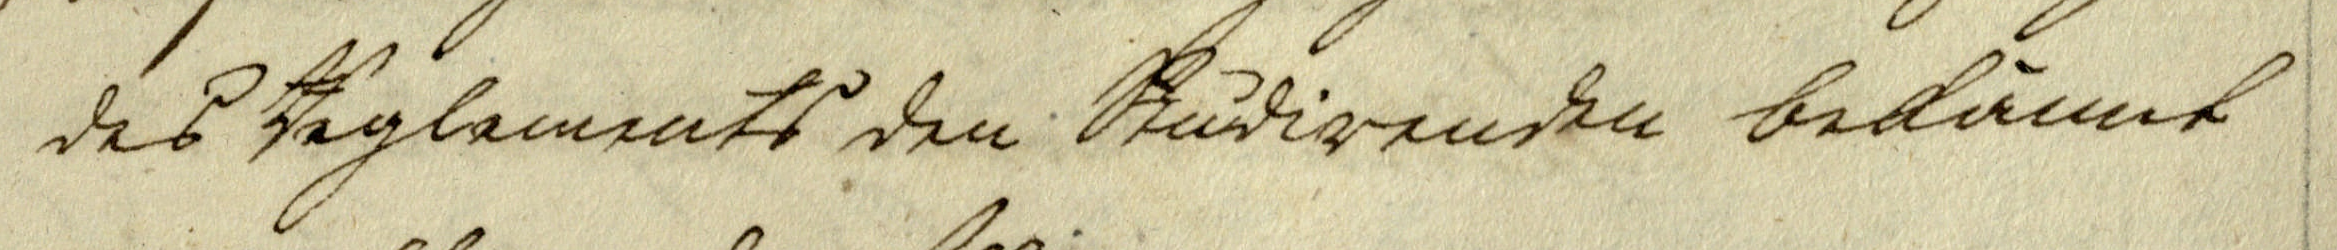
des Reglements den Studirenden bekannt
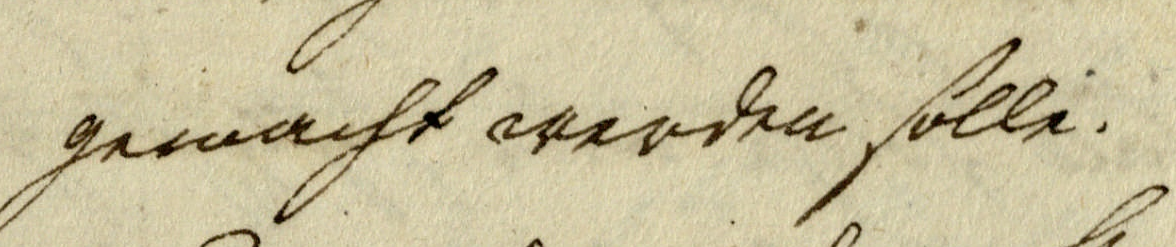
gemacht werden solle.
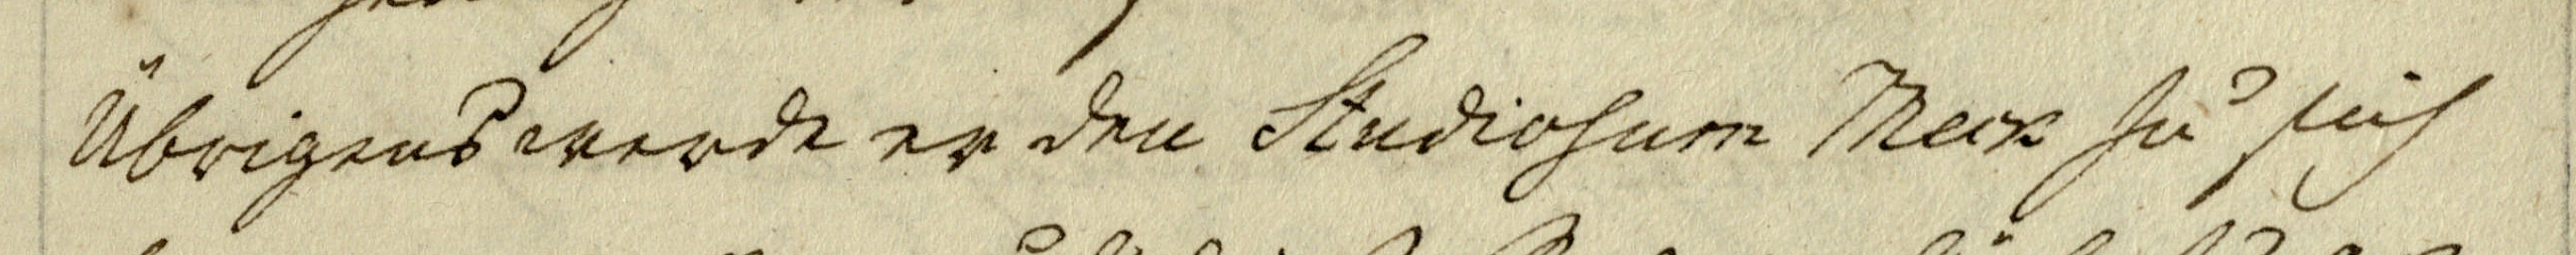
Übrigens werde er den Studiosum Meck zu sich
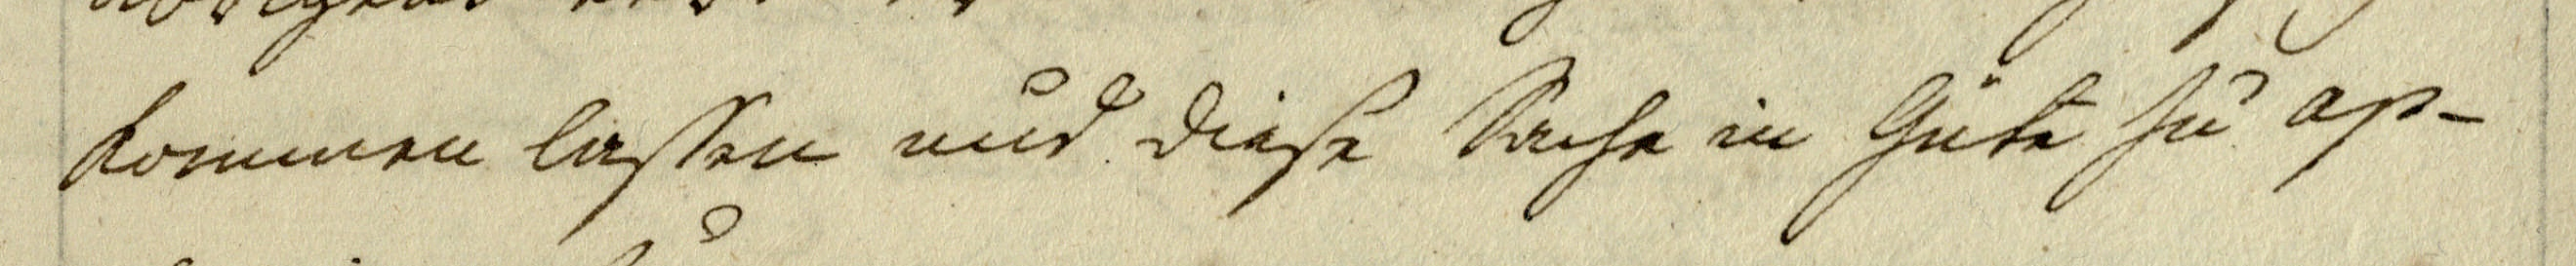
kommen lassen und diese Sache in Güte zu ap¬
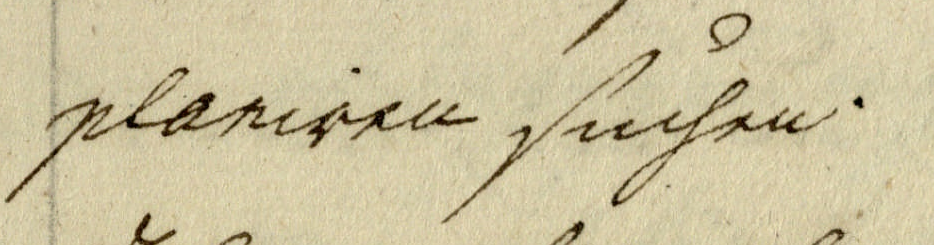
planiren suchen.
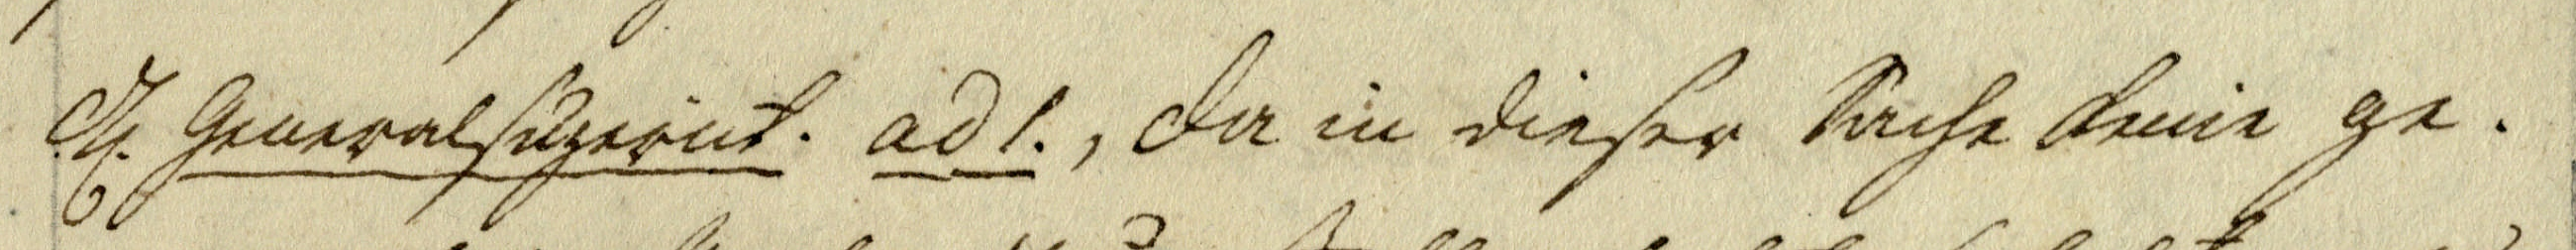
dh. Generalsuperint. ad 1., Da in dieser Sache keine ge¬
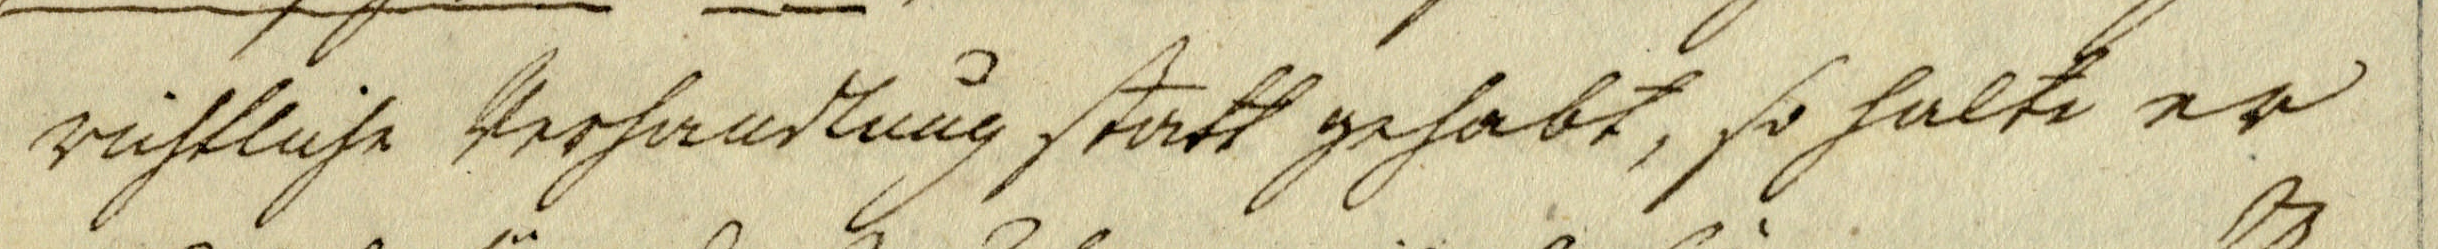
richtliche Verhandlung statt gehabt, so halte er
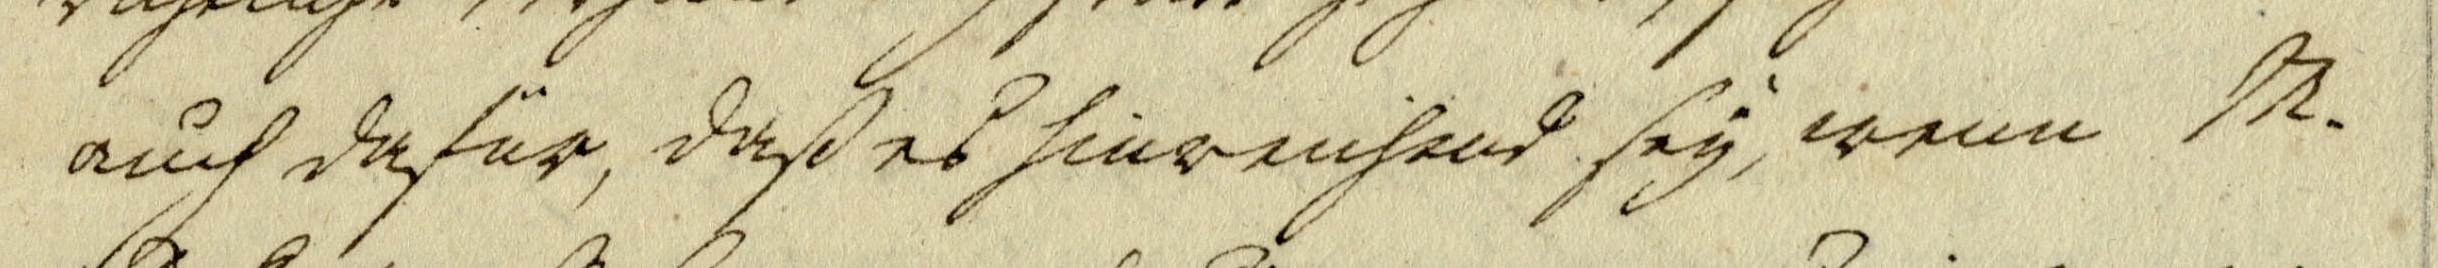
auch dafür, daß es hinreichend seÿ, wenn M.
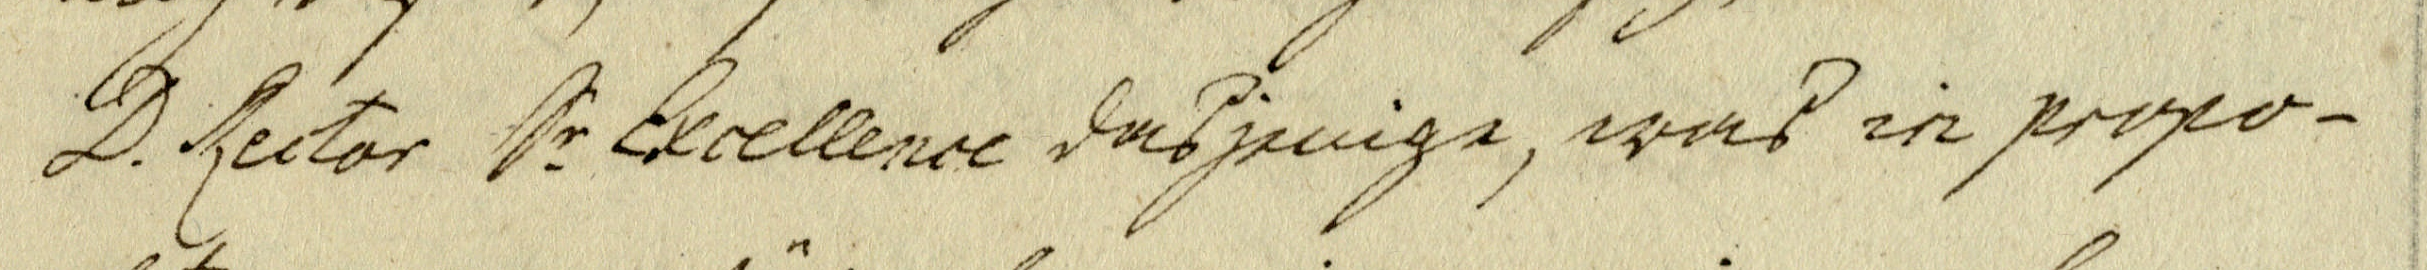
D. Rector Sr Excellence dasjenige, was in propo¬
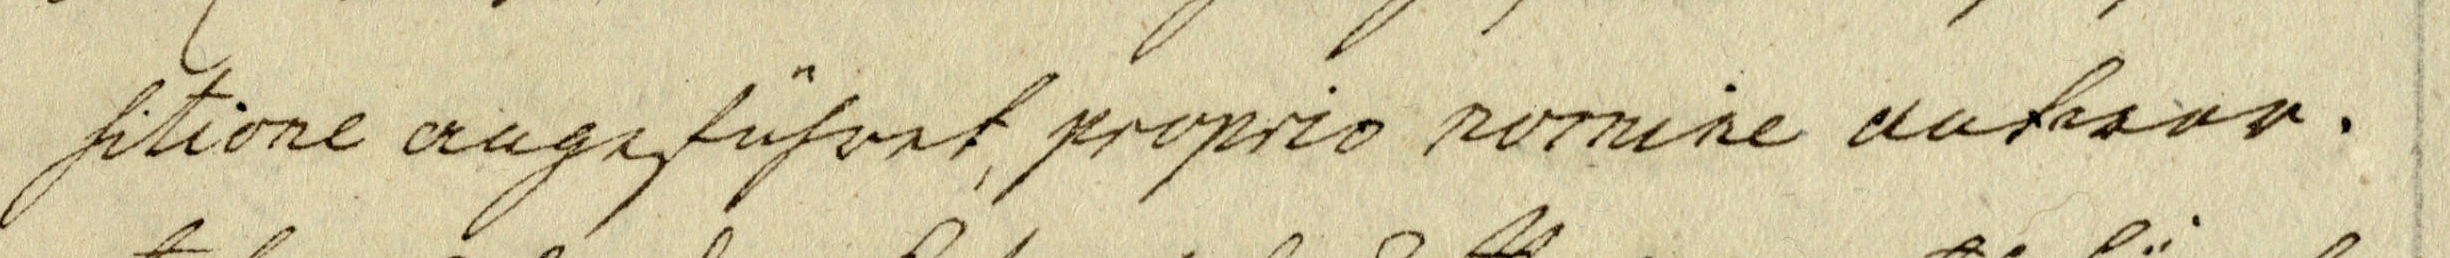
sitione angeführet, proprio nomine antwor¬
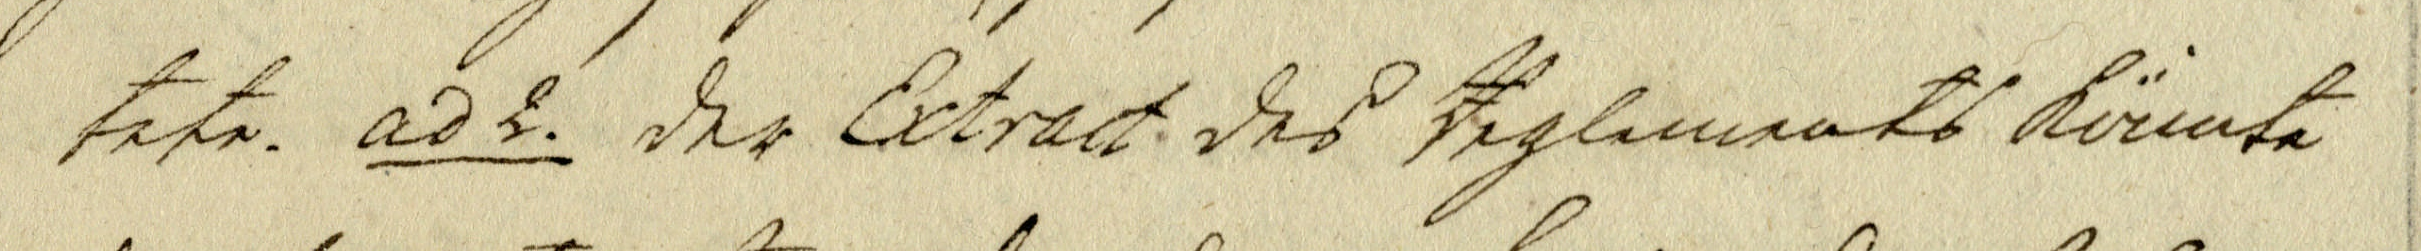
tete. ad 2. der Extract des Reglements könnte
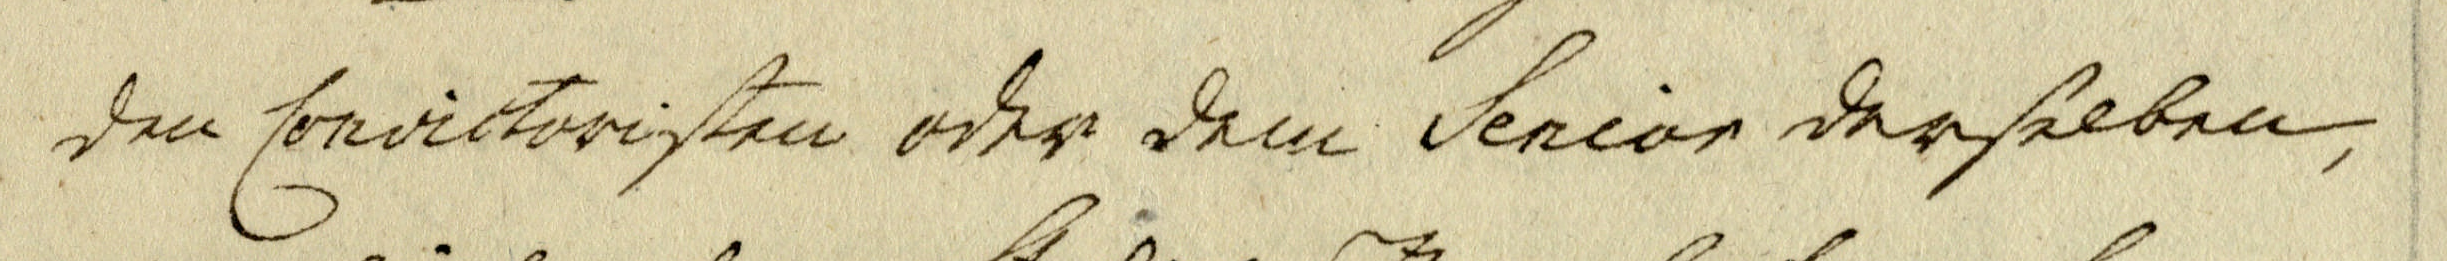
den Convictoristen oder dem Senior derselben.
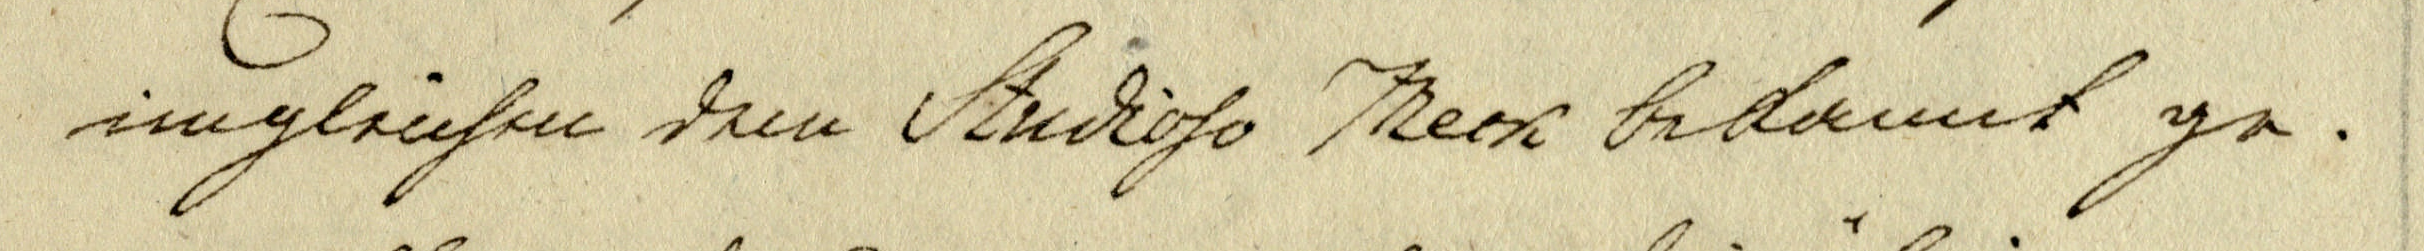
imgleichen dem Studioso Meck bekannt ge¬
